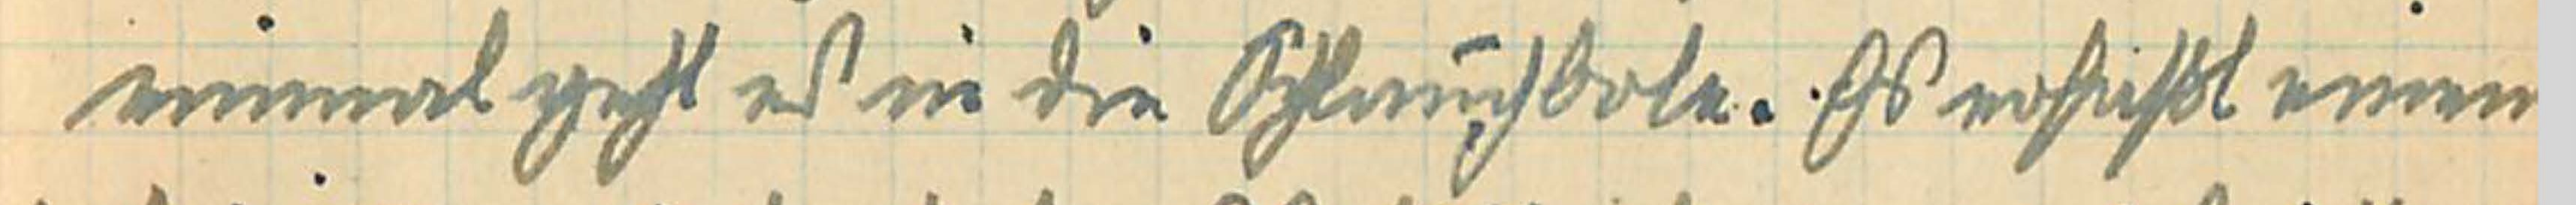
einmal geht es in die Schlauchbote. Es erfaßt einen
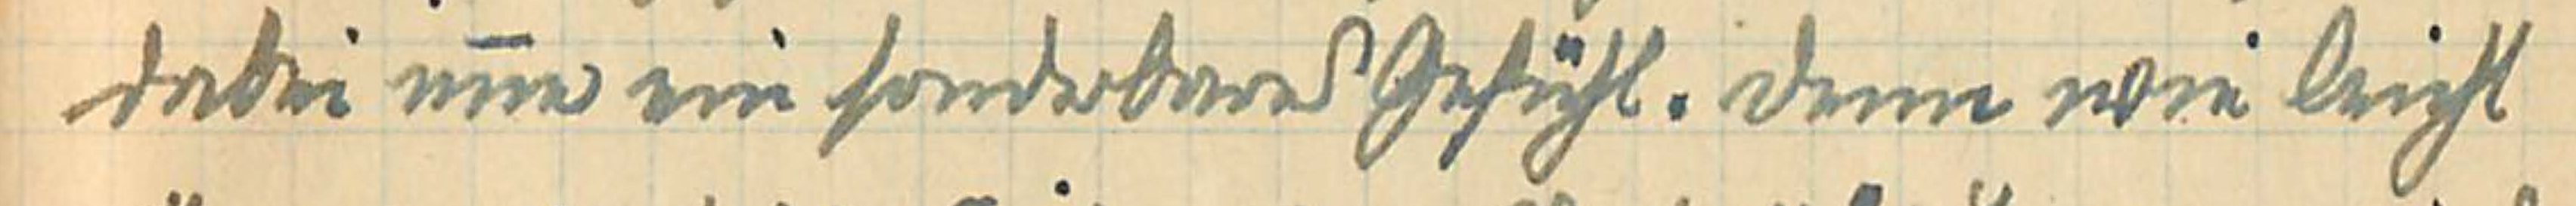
dabei immer ein sonderbares Gefühl. Denn wie leicht
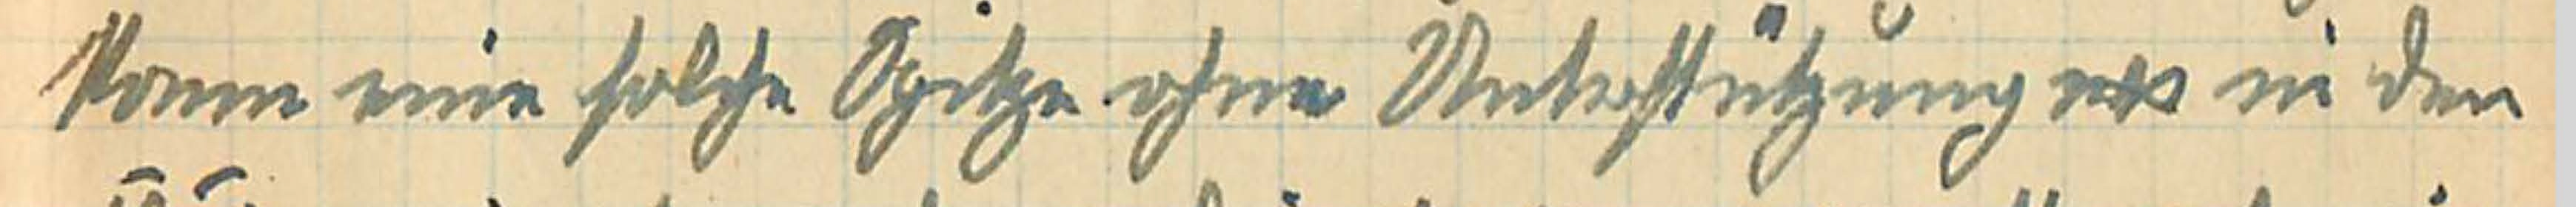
kann eine solche Spitze ohne Unterstützung xxx in den
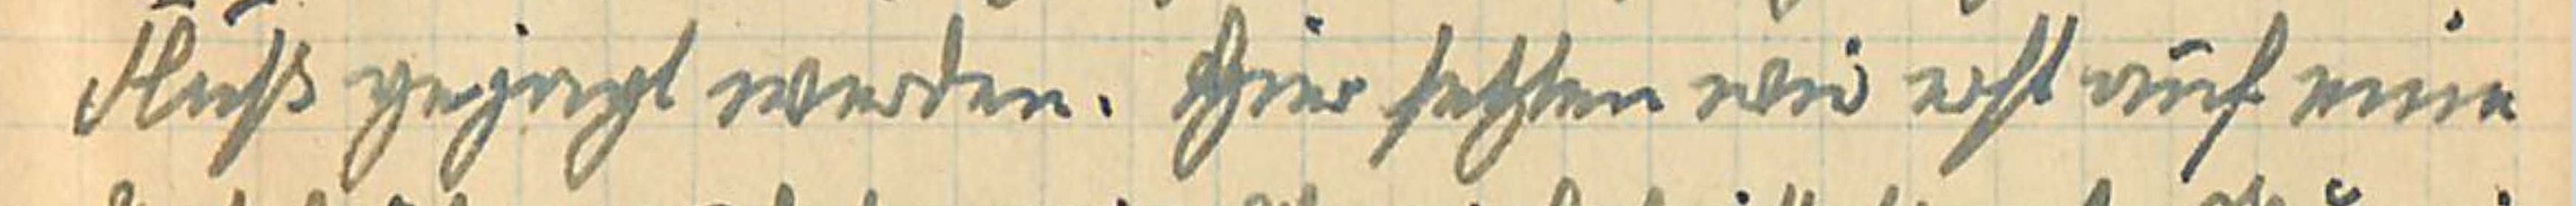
Fluß gejagt werden. Hier setzten wir erst auf eine
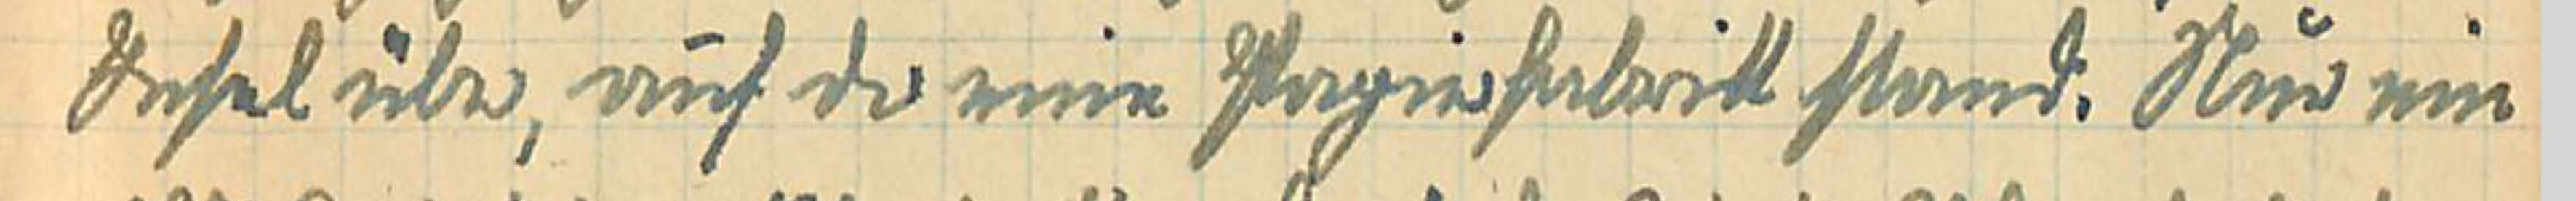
Insel über, auf der eine Papierfabrik stand. Nur ein
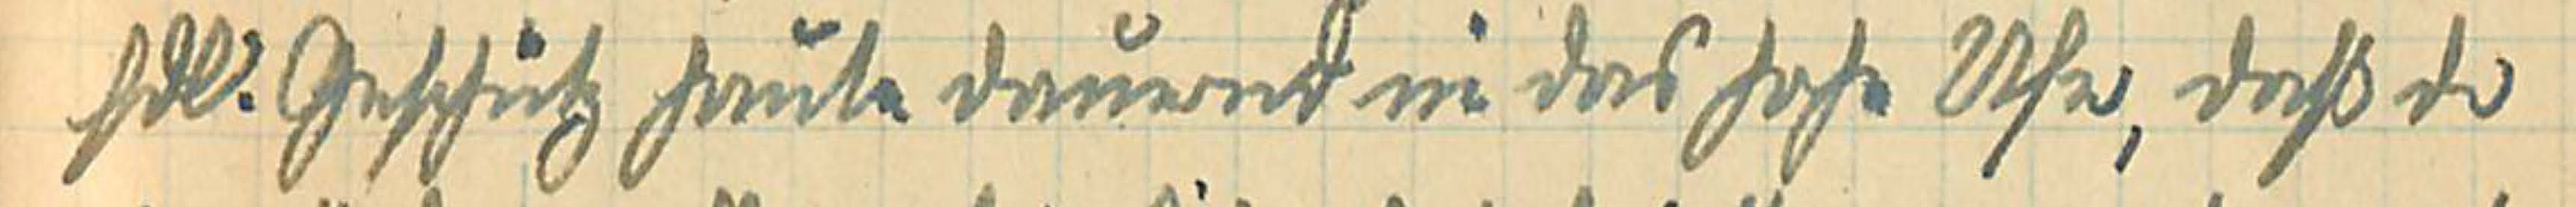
fdl. Geschütz haute dauernd in das hohe Ufer, daß der
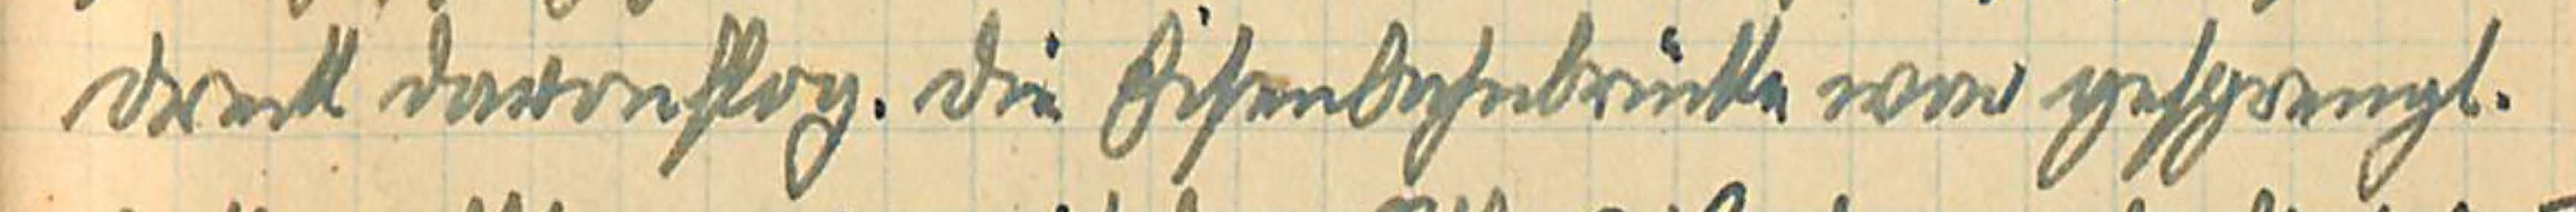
Dreck davonflog. Die Eisenbahnbrücke war gesprengt.
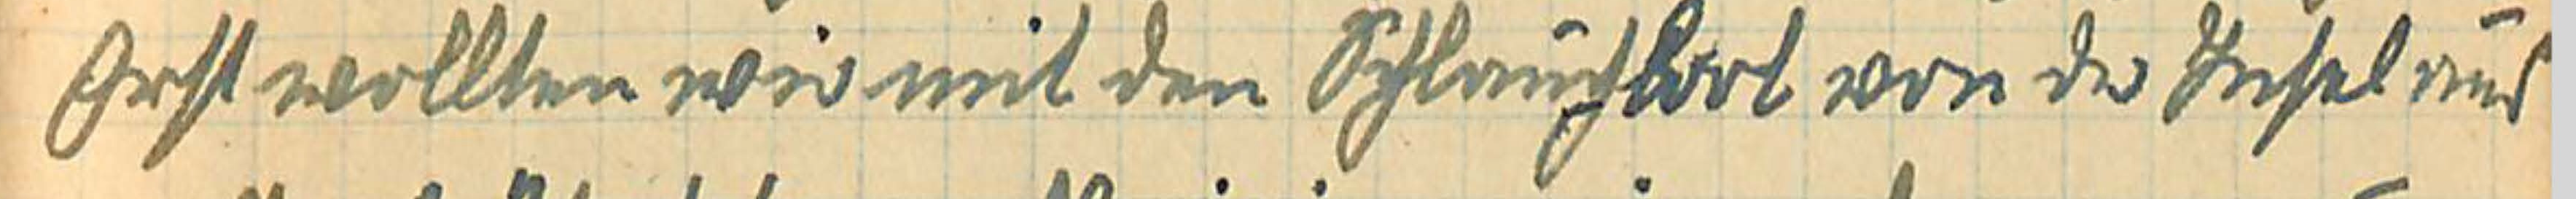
Erst wollten wir mit den Schlauchboot von der Insel aus
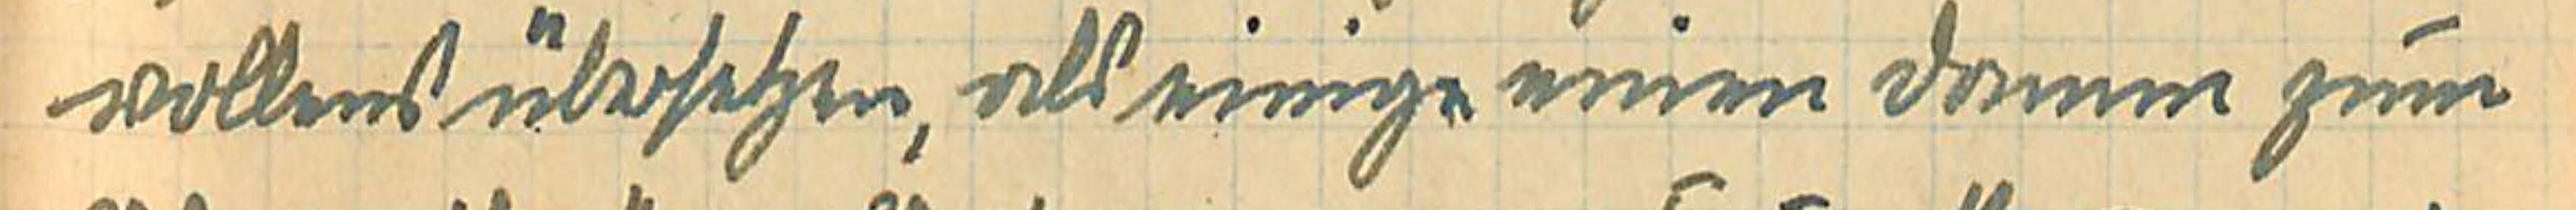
vollens übersetzen, als einige einen Damm zum
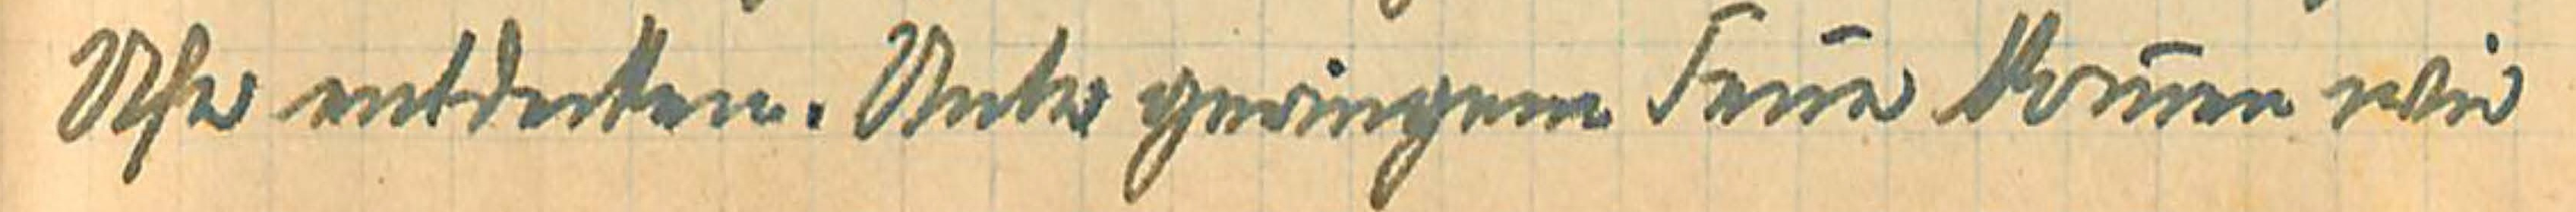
Ufer entdeckten. Unter geringem Feuer kommen wir
